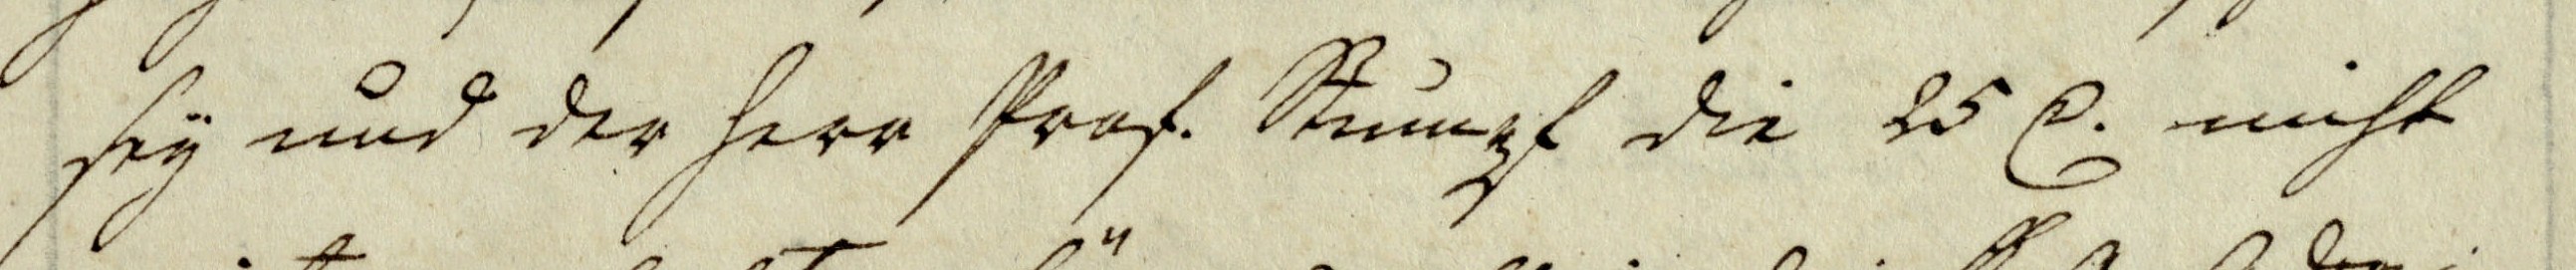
seÿ und der Herr Prof. Stumpf die 25 l. nicht
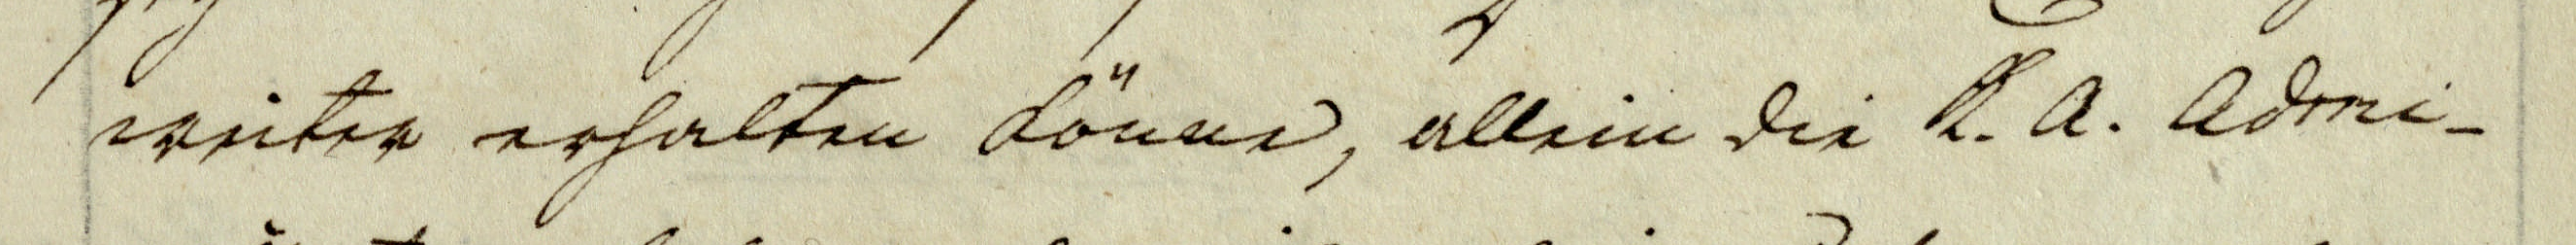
weiter erhalten könne, allein die K. A. Admi¬
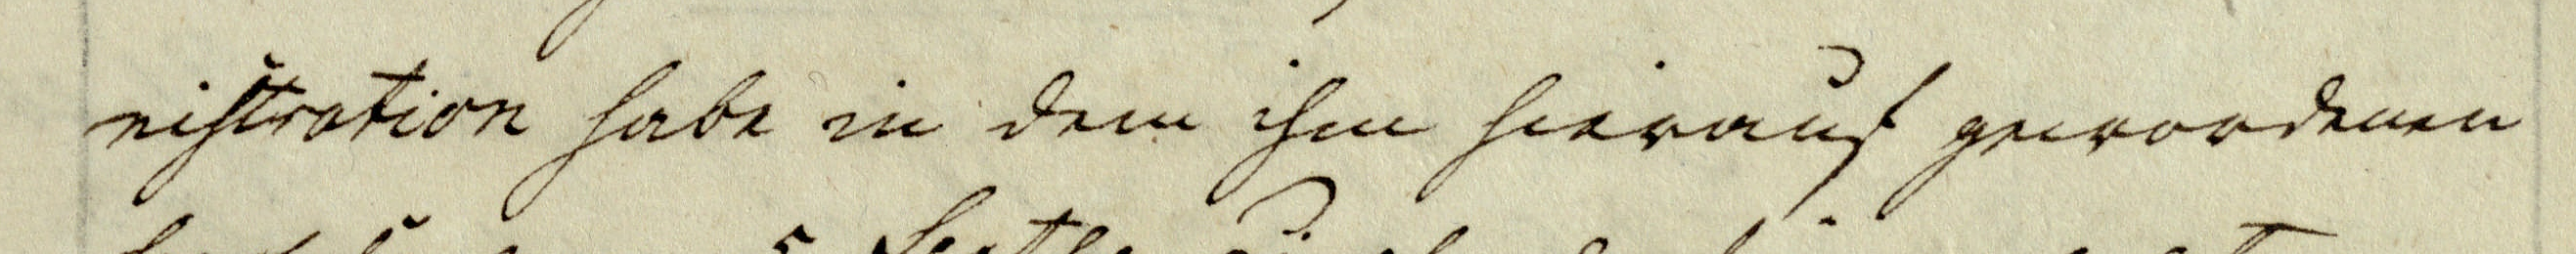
nistration habe in dem ihm hierauf gewordenen
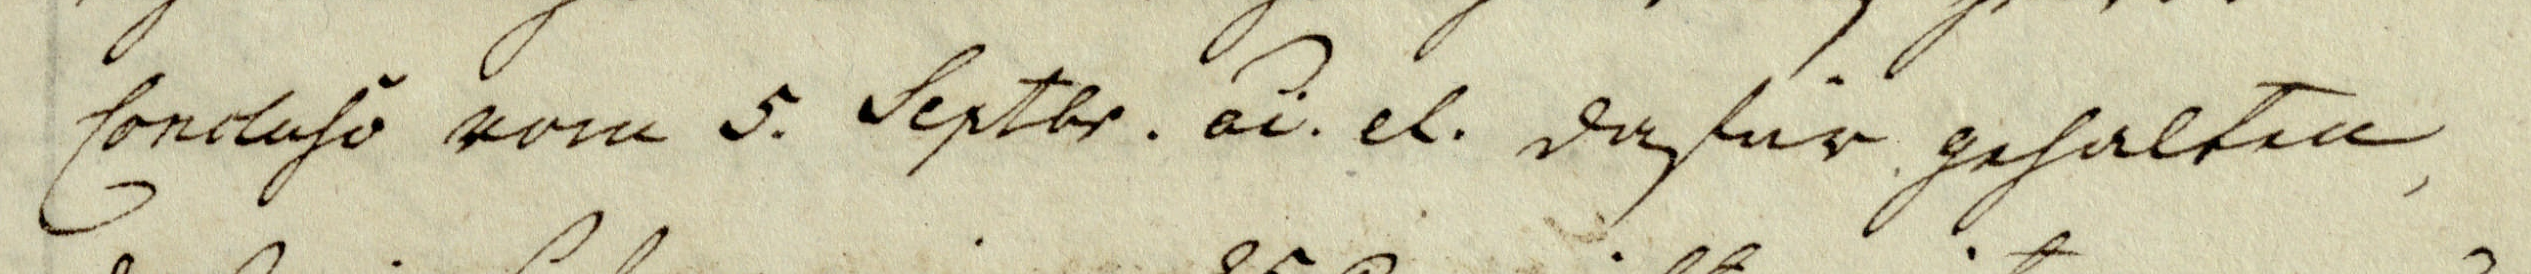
Concluso vom 5. Septbr. ai. el. dafür gehalten,
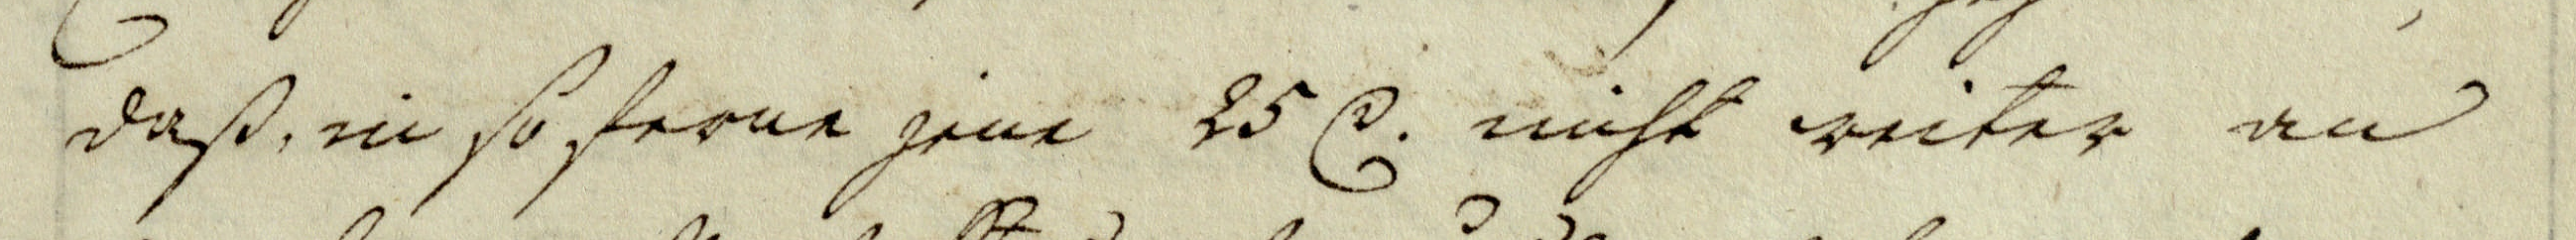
daß in so ferne jene 25 l. nicht weiter an
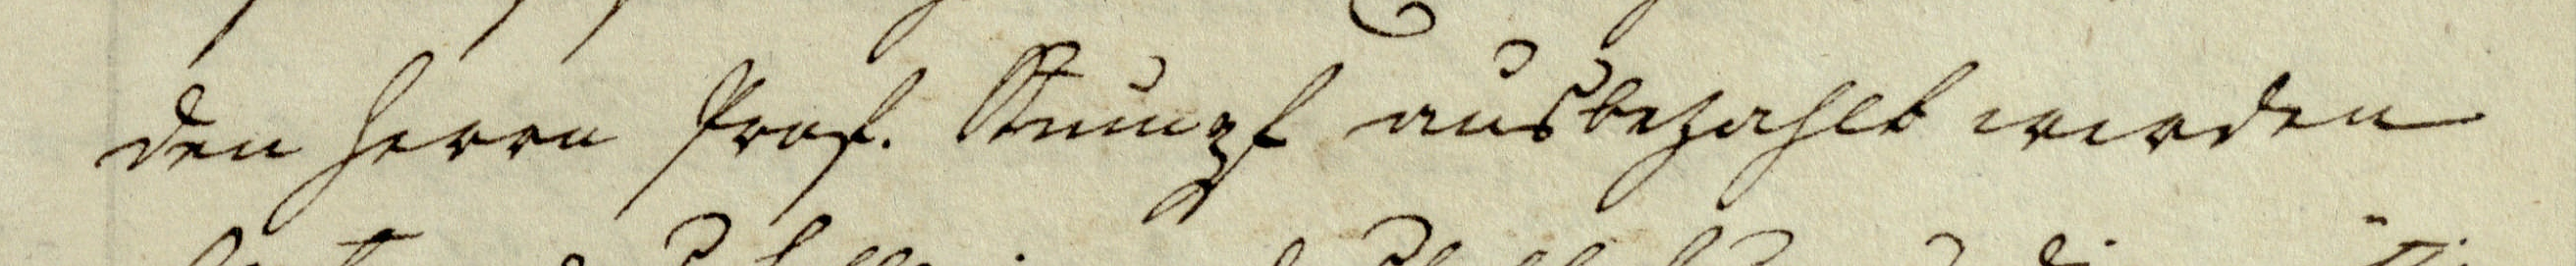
den Herrn Prof. Stumpf ausbezahlt werden
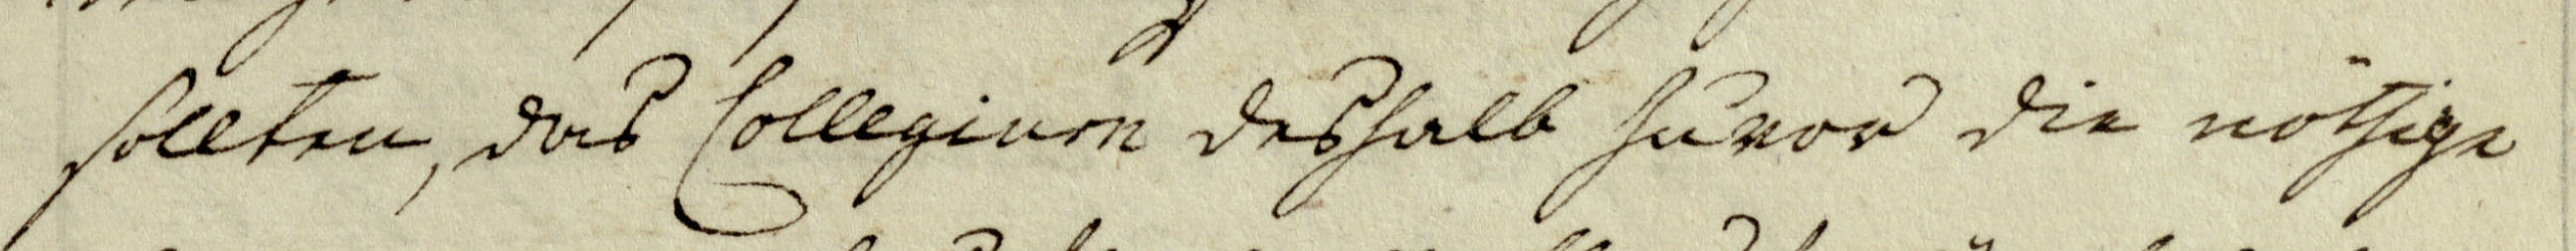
sollten, das Collegium deshalb zuvor die nöthige
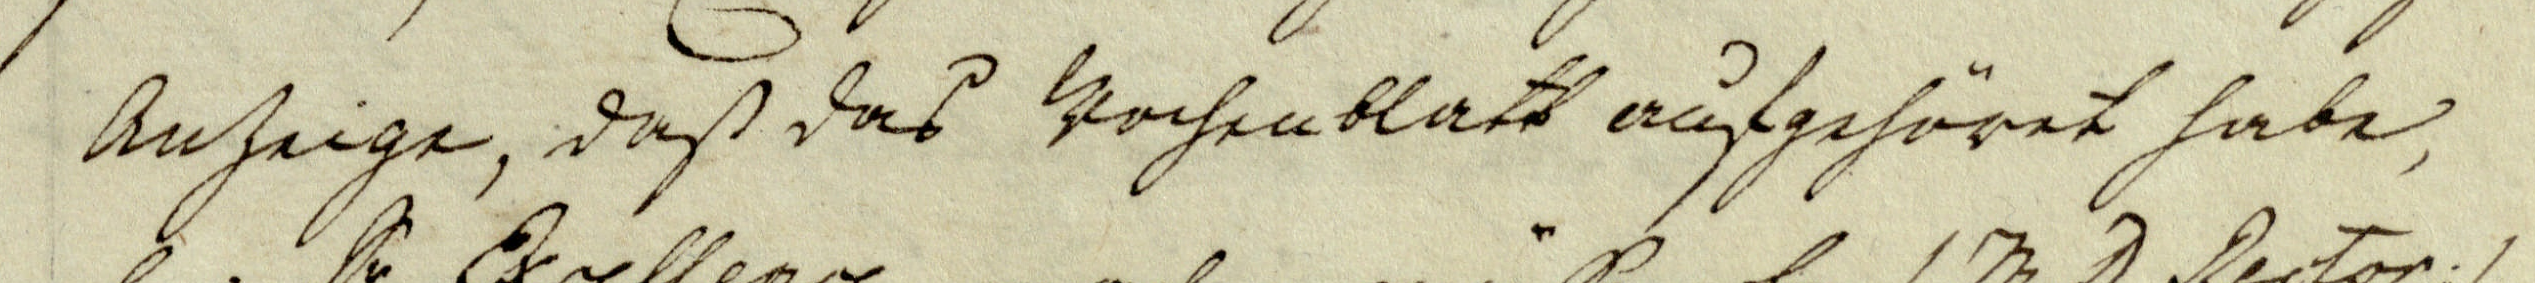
Anzeige, daß das Wochenblatt aufgehöret habe,
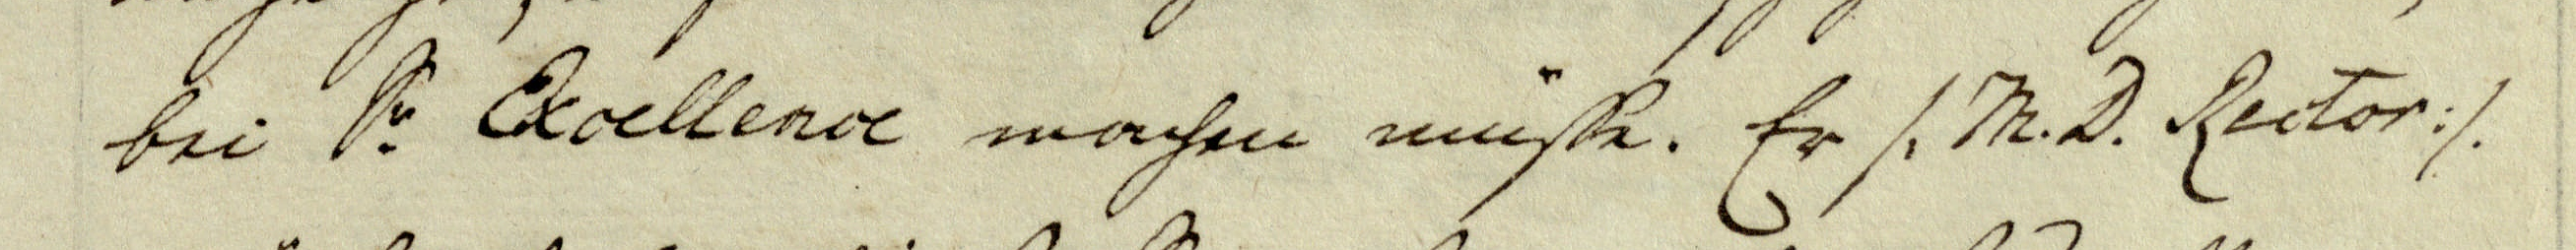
bei Sr Excellence machen müsse. Er /: M. D. Rector :/.
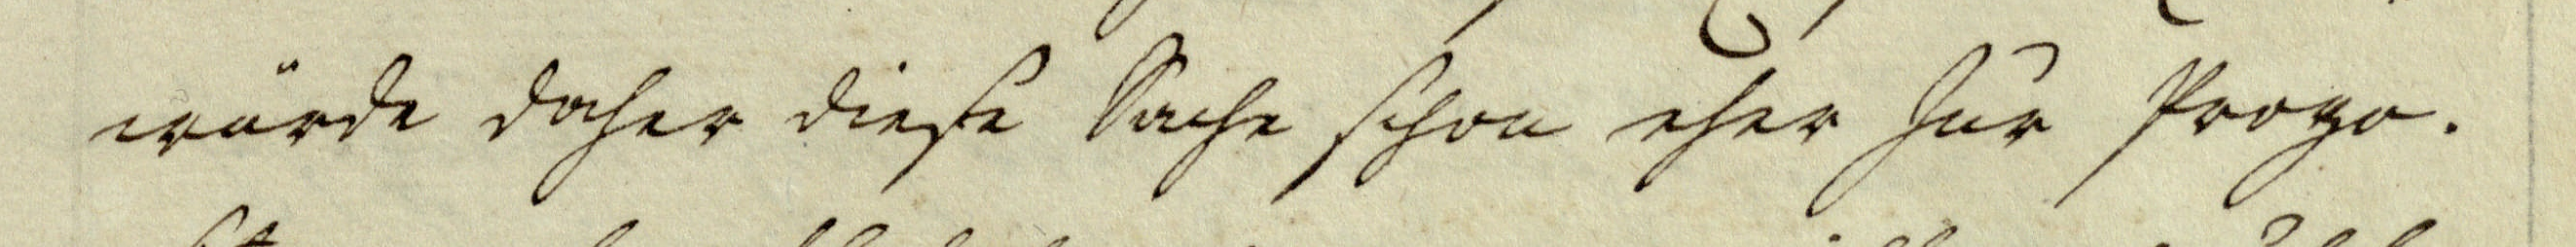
würde daher diese Sache, schon eher zur Propo¬
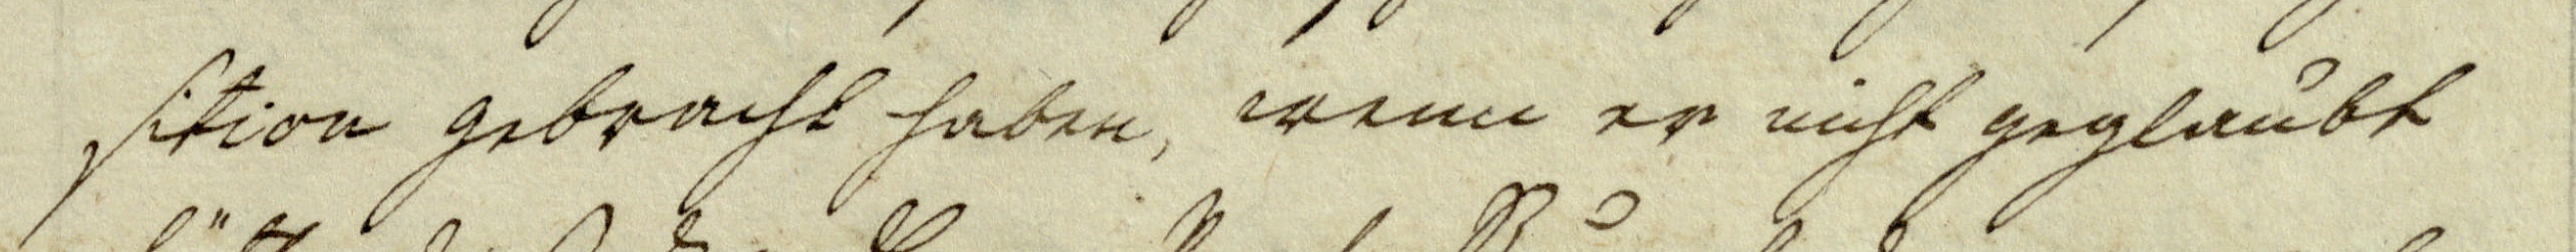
sition gebracht haben, wenn er nicht geglaubt
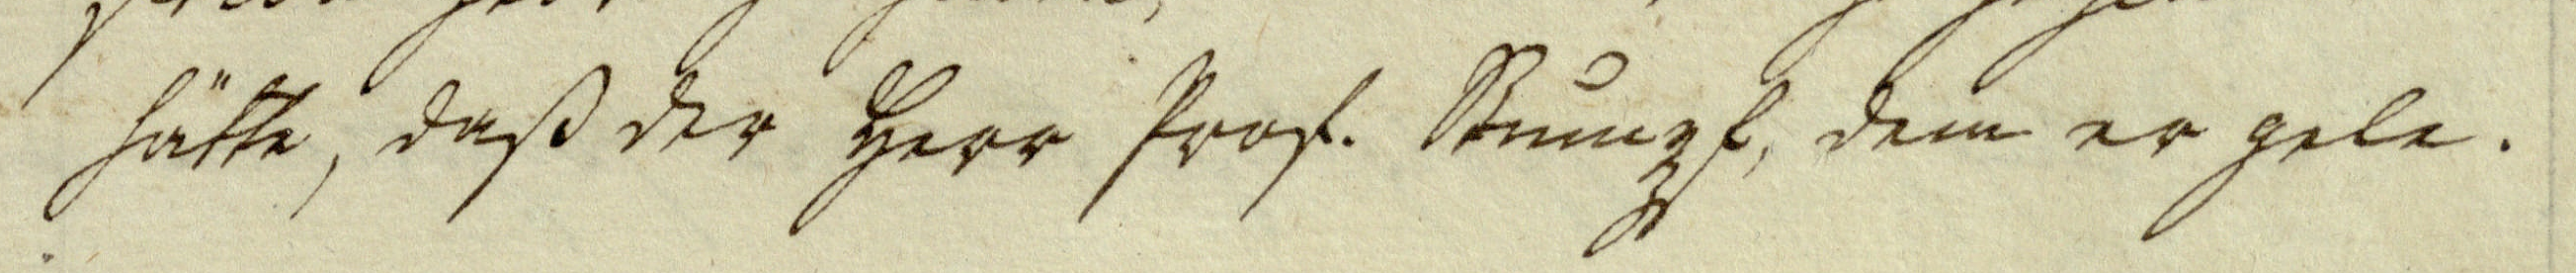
hätte, daß der Herr Prof. Stumpf, dem er gele¬
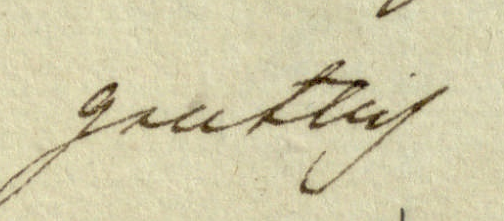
gentlich
